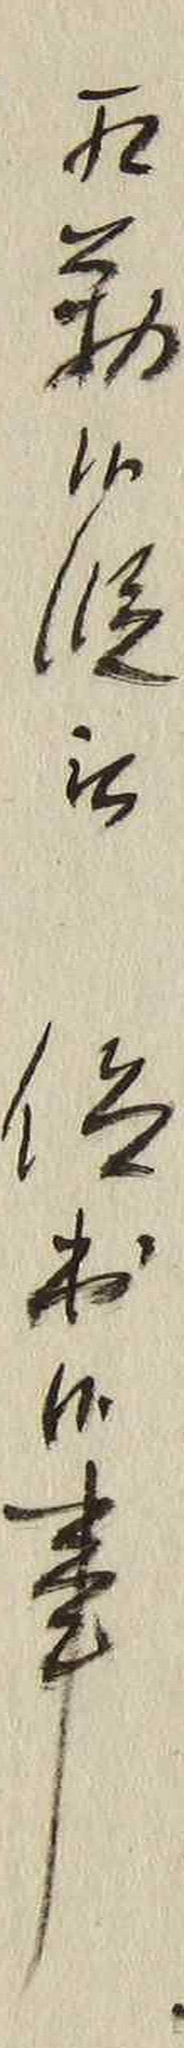相勤候段被仰出候事
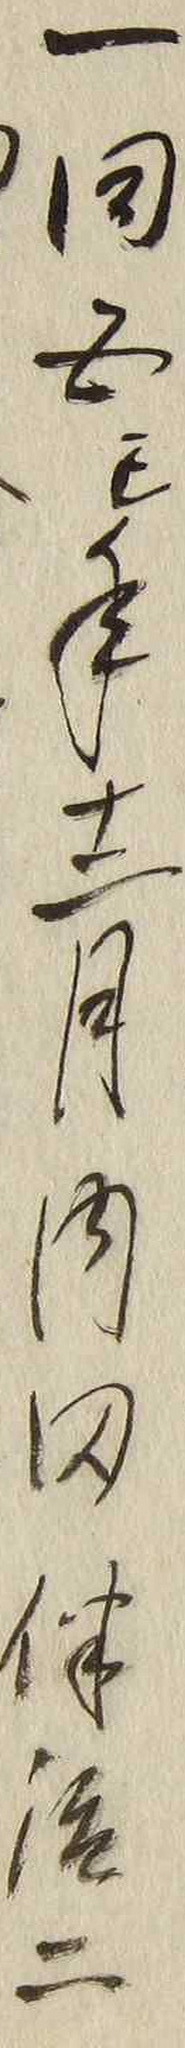一同五巳年十二月内田伴治二
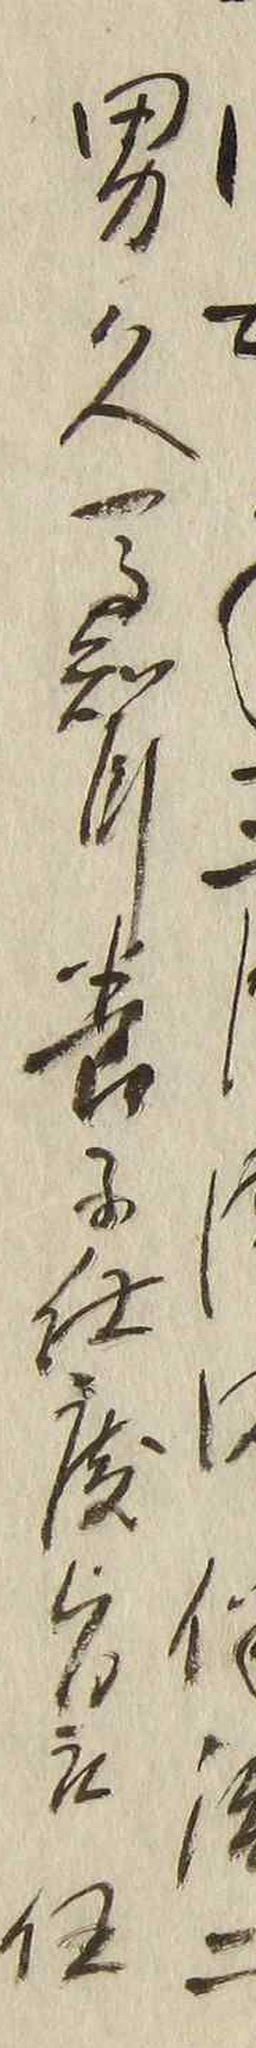男久馬婿養子仕度旨被任

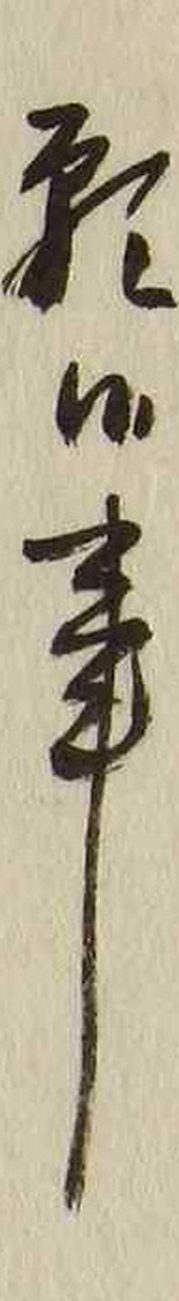願候事
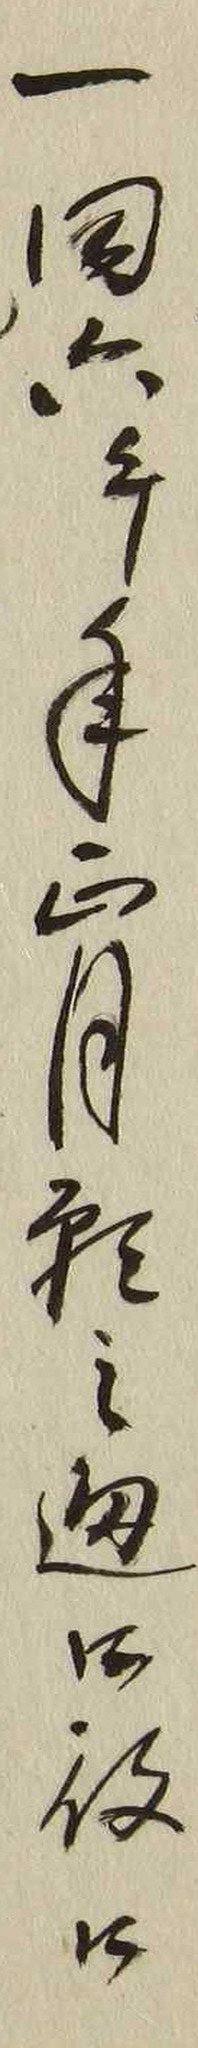一同六午年正月願之通御役御
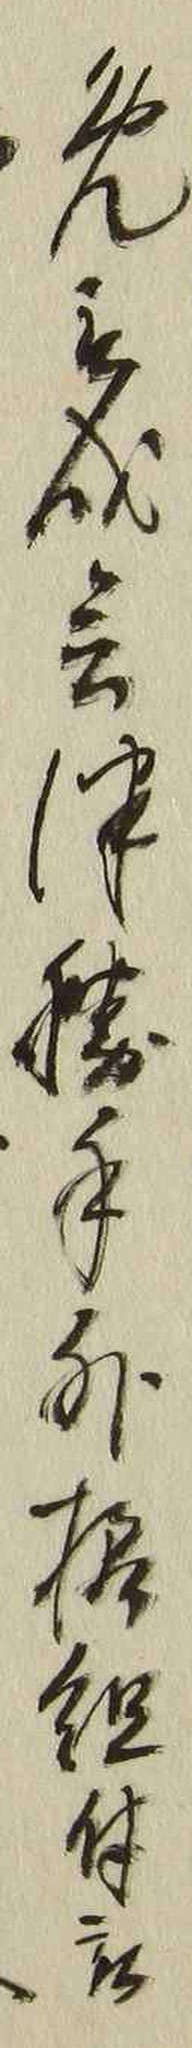免被成会津勝手外様組付被
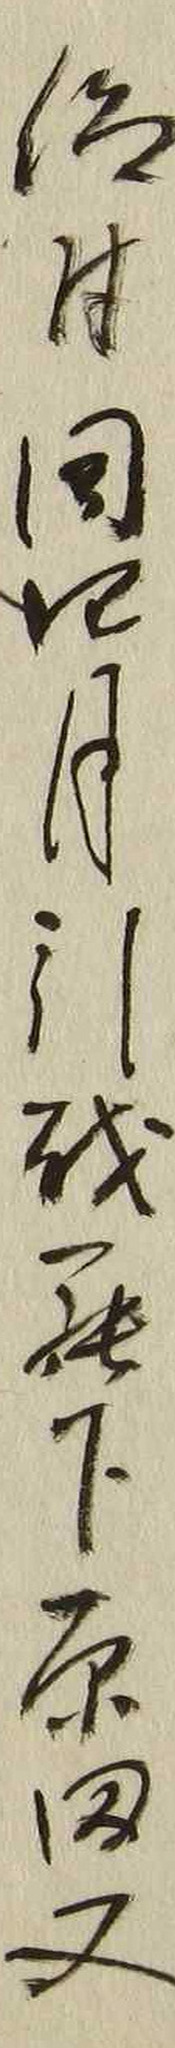仰付同四月引越罷下原田又
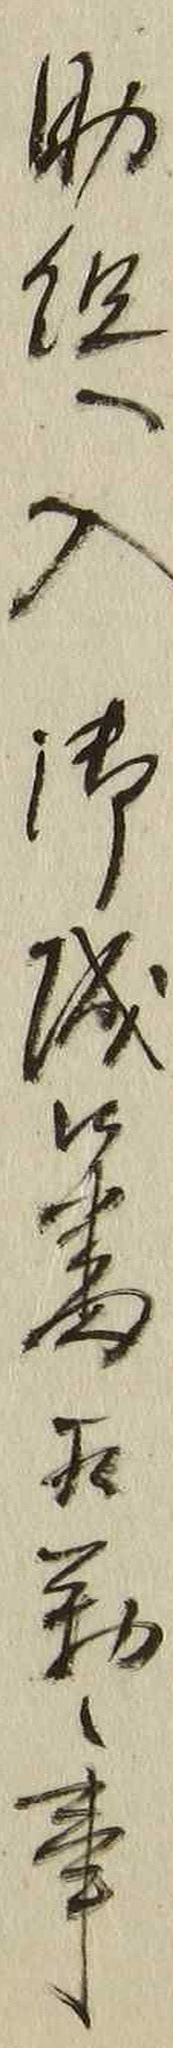助組へ入御城御番相勤候事
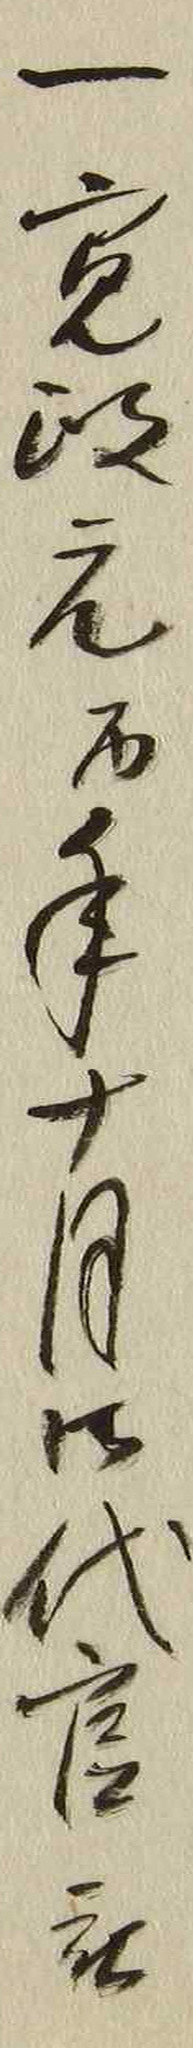一寛政元酉年十月御代官被
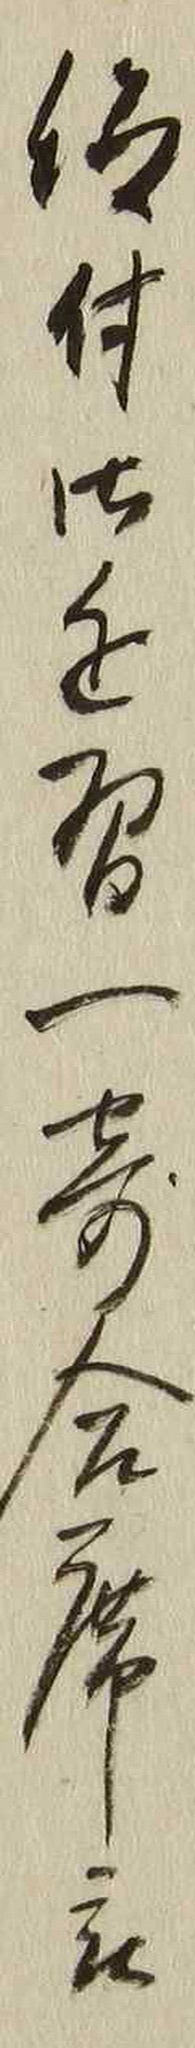仰付御近習一寄合席被
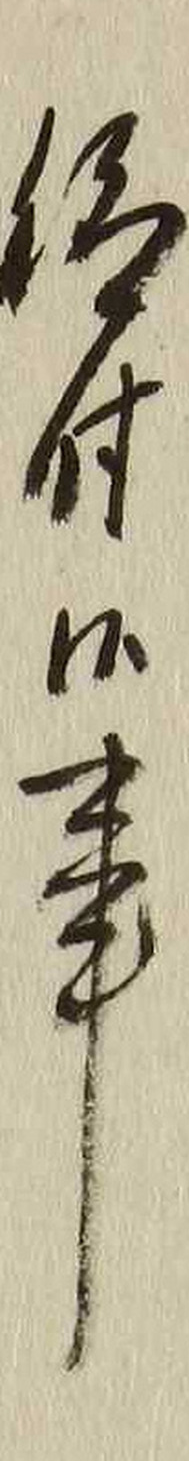仰付候事
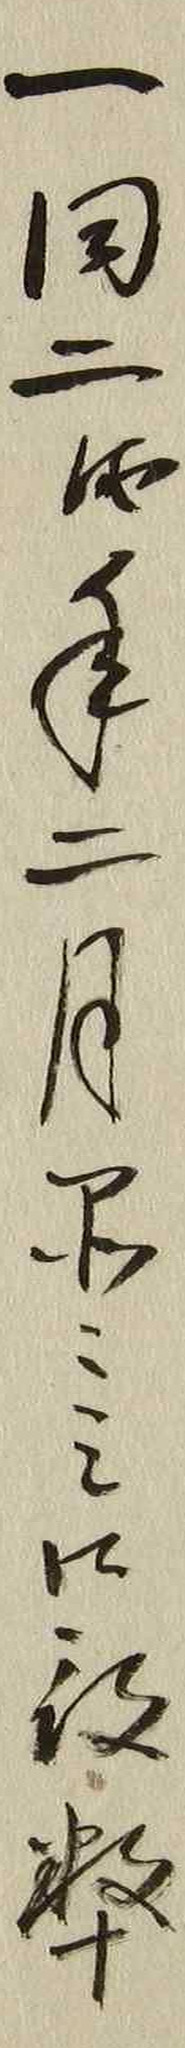一同二戌年二月品々之御役数十
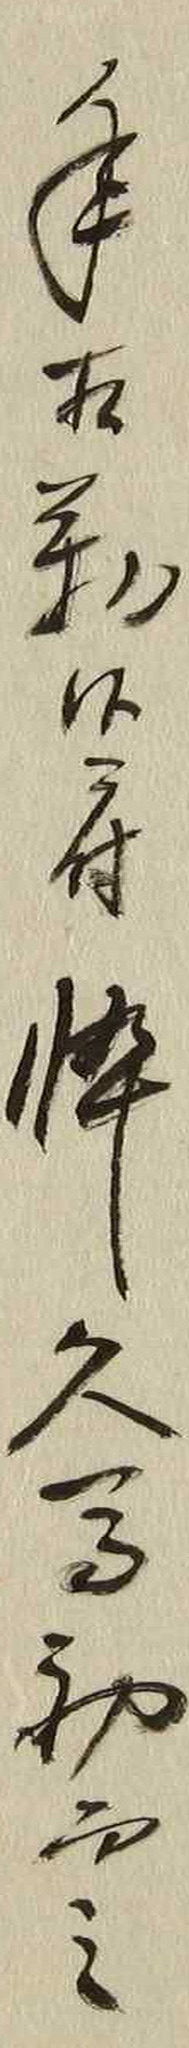年相勤候ニ付忰久馬初而之
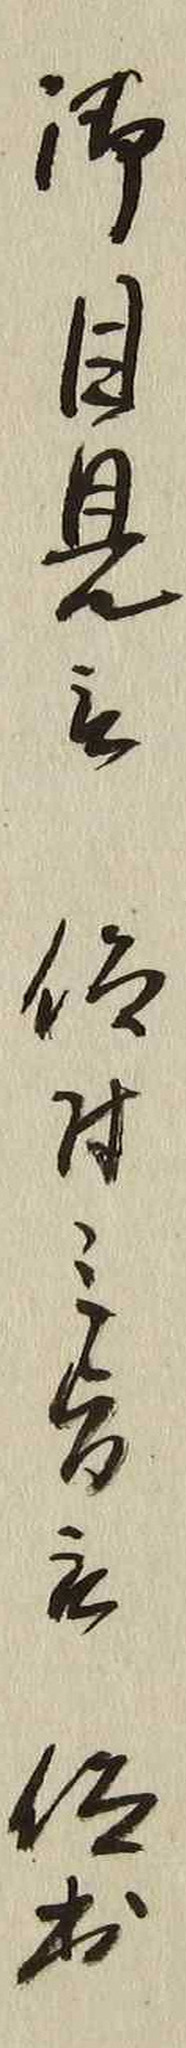御目見被仰付之旨被仰出
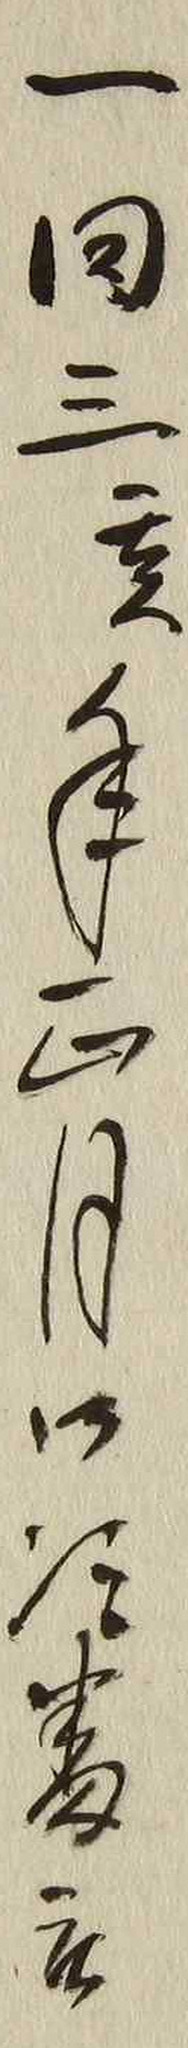一同三亥年正月御次番被
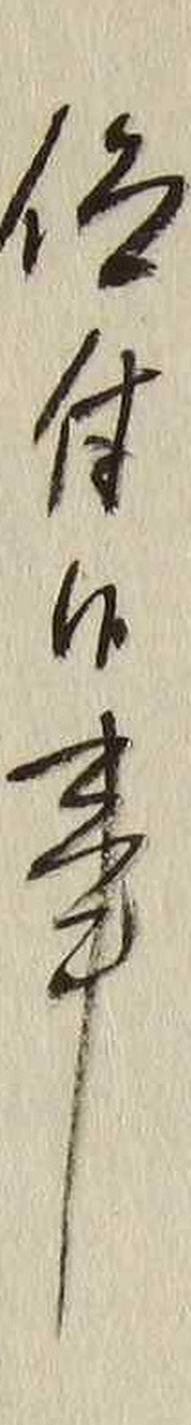仰付候事
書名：諸士系譜　巻之359　す之部9
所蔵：会津若松市立会津図書館
